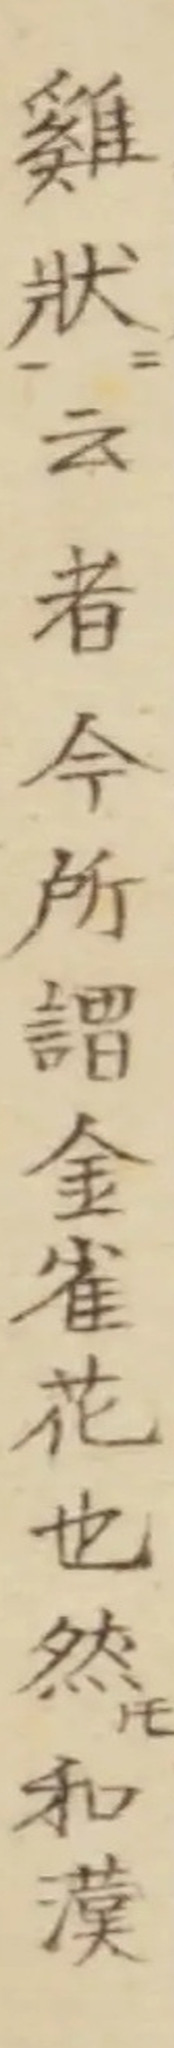鶏状ニ云者今所謂金雀花也然共和漢
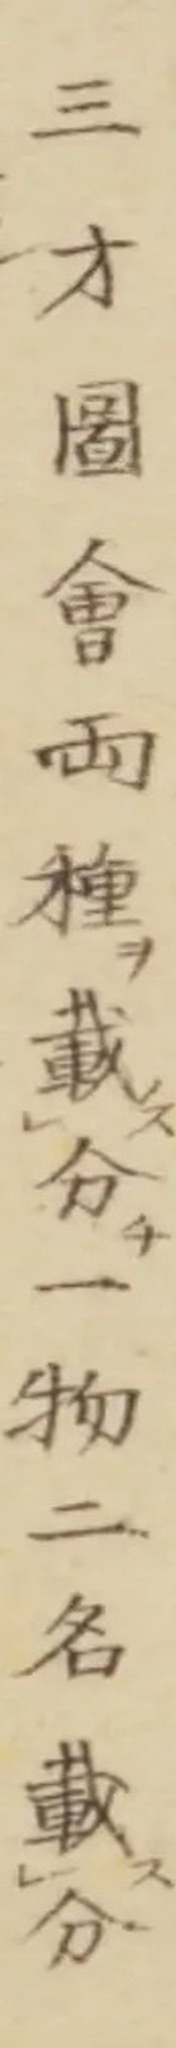三才圖會両種ヲ載ス分チ一物二名載ス分

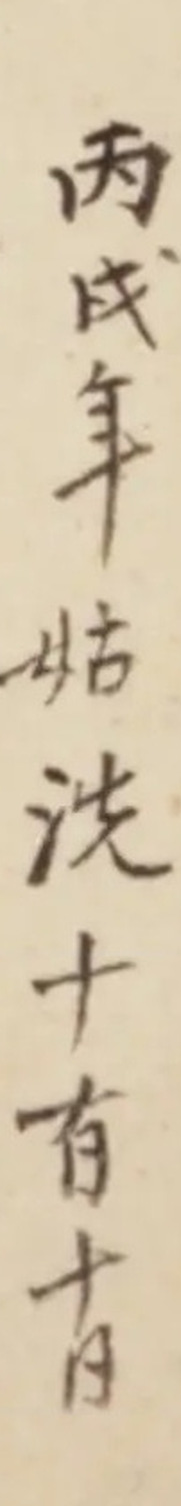丙戌姑洗十有十日
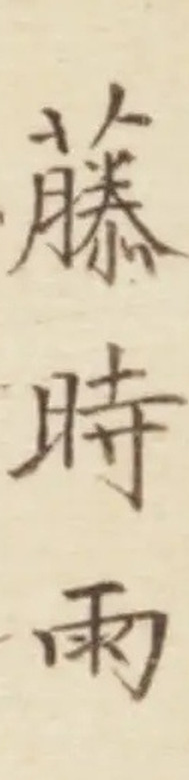藤時雨
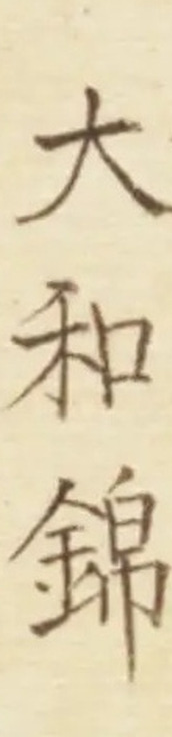大和錦

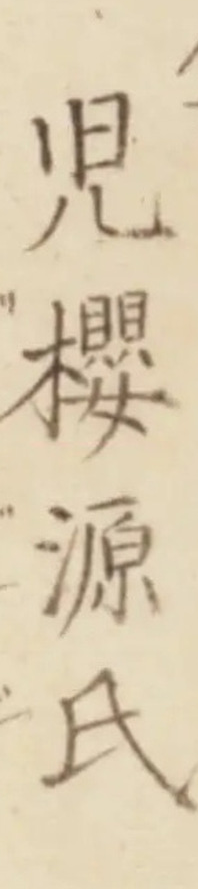児櫻源氏
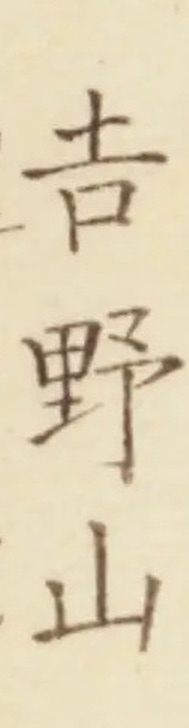吉野山

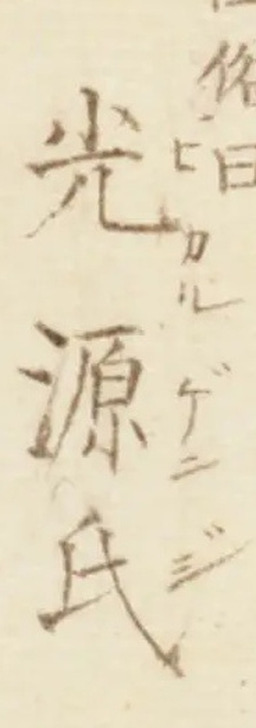光源氏

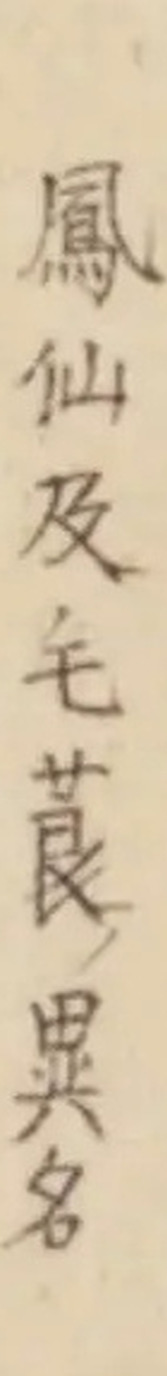鳳仙及毛莨ノ異名
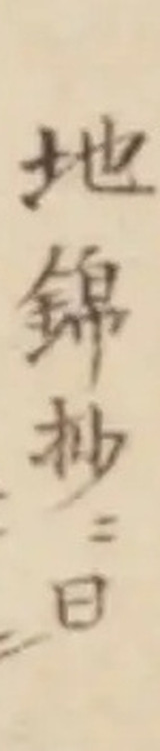地錦抄に曰
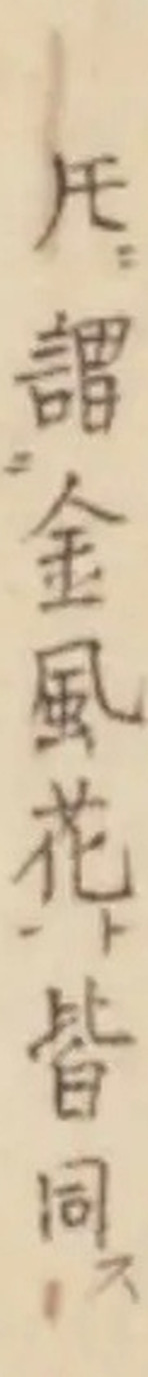共ニ謂金風花ト皆同ス
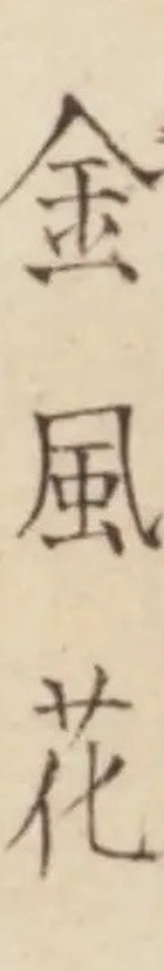金風花
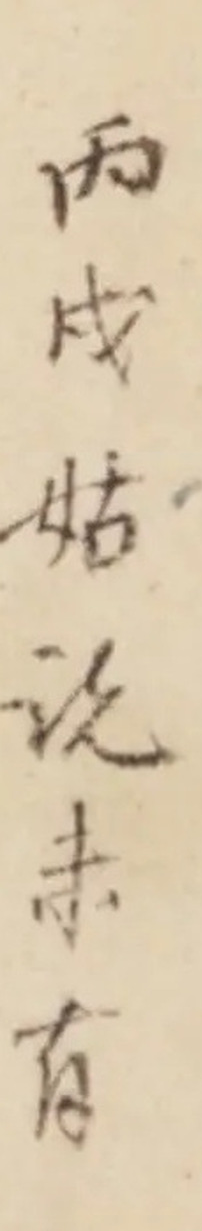丙戌姑洗末有
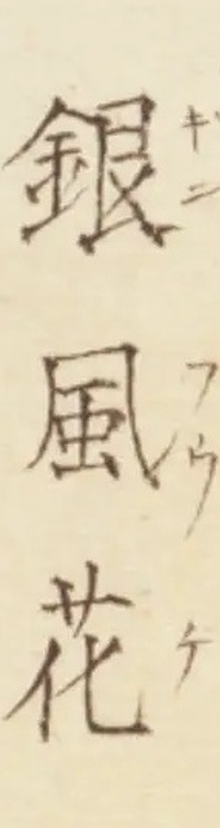銀風花

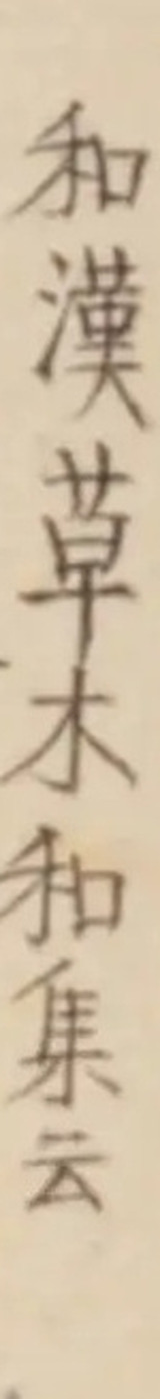和漢草木和集云
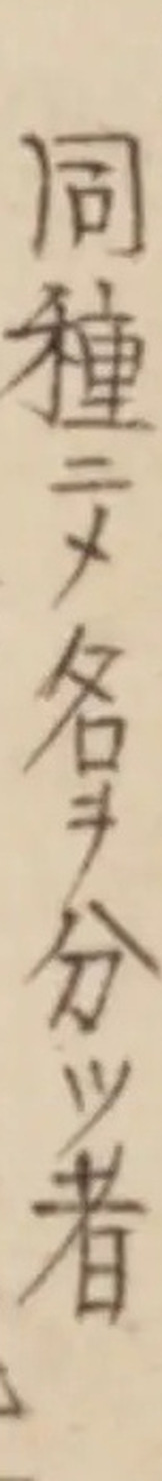同種ニメ名ヲ分ツ者
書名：梅園草木花譜春之部. 3
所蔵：国立国会図書館 National Diet Library, JAPAN
